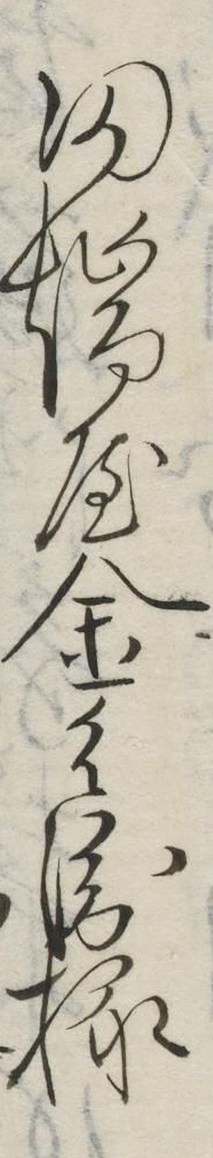田端屋金兵衛様
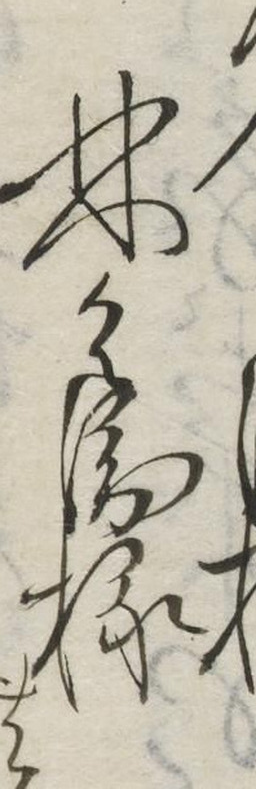林兵衛様
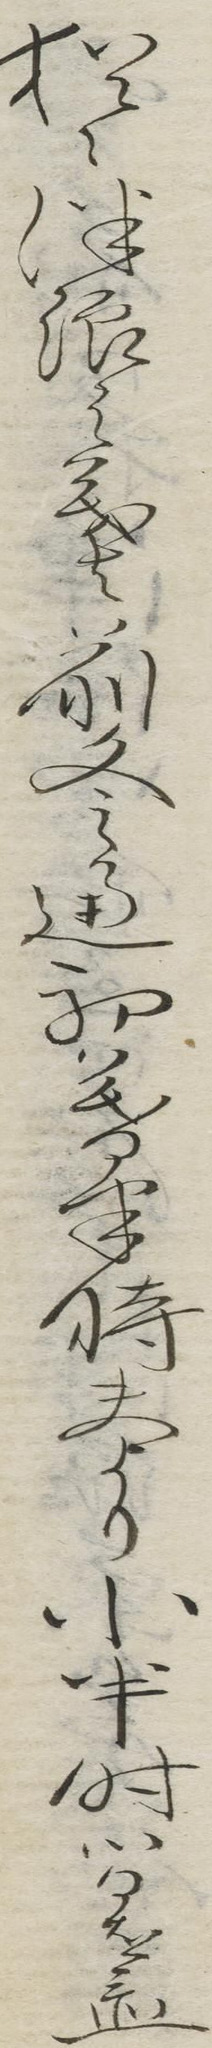猶々津浪之義は前文之通初暮半時夫より小半時間を置

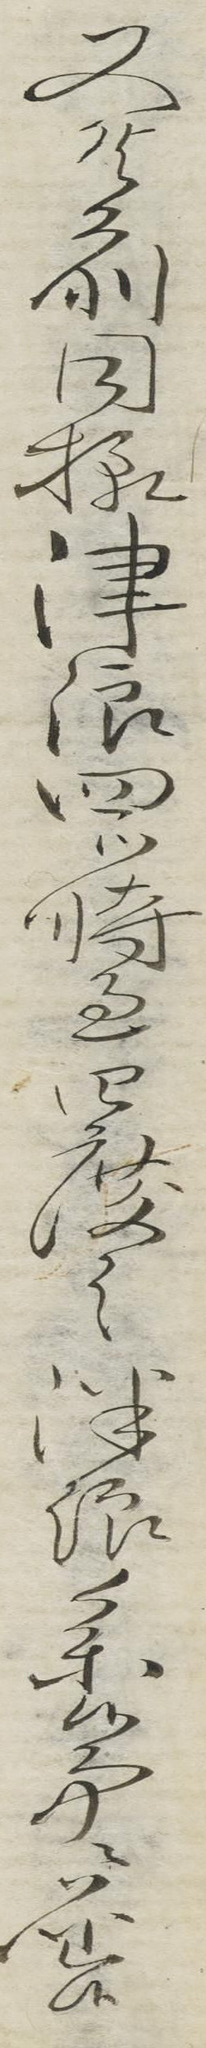又候前同様津浪四ツ時過四度之津浪参候事ニ御座候
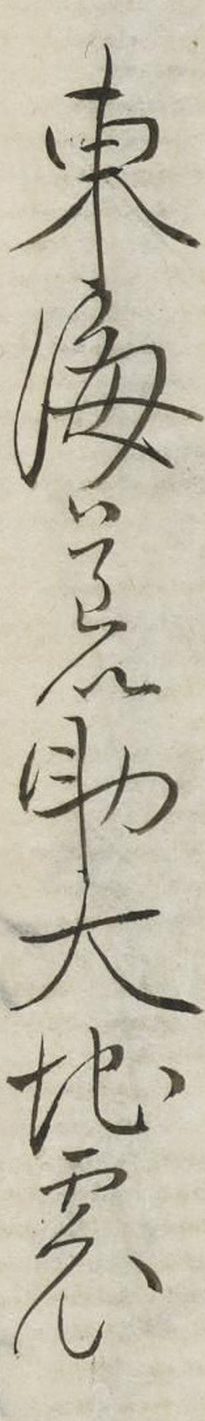東海道筋大地震
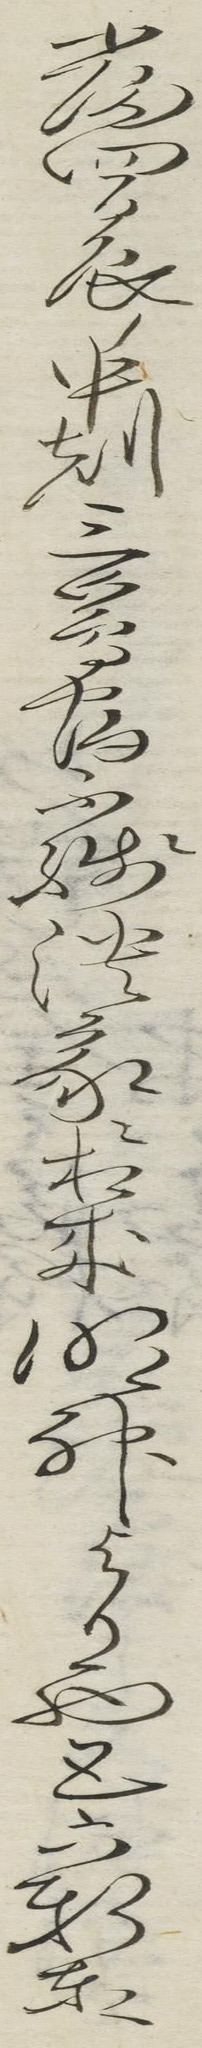當四日辰ノ中刻三嶌宿不残潰家ニ相成明神より西五六軒東へ
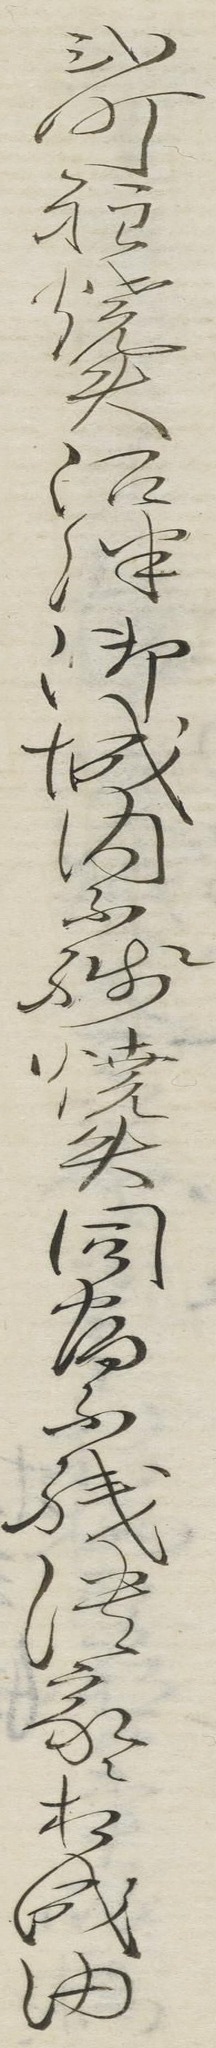弐町程焼失沼津御城内不残焼失同宿不残潰家ニ相成由
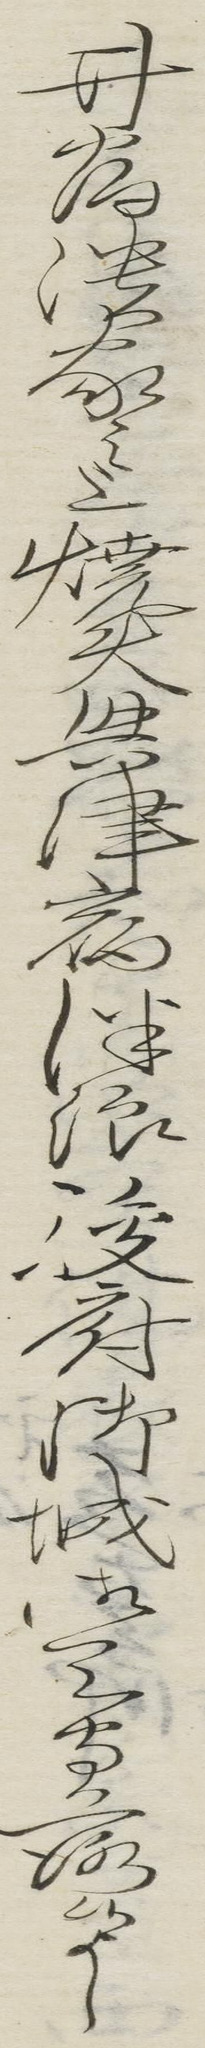井宿潰家之上焼失興津宿津浪駿府御城御天守落候よし
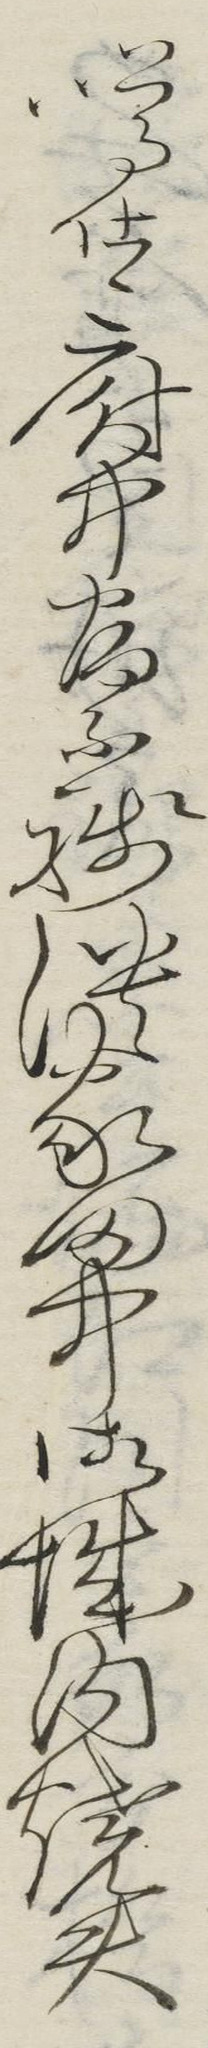噂仕候府中宿不残潰家田中御城内焼失
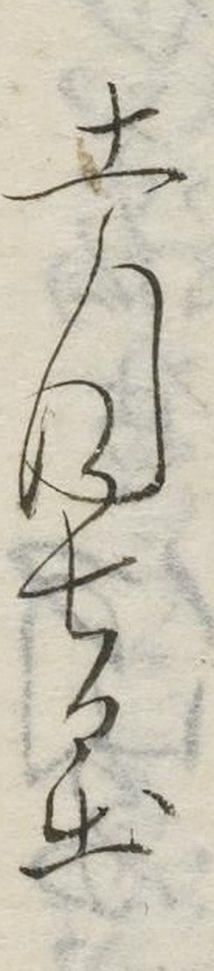十一月七日出
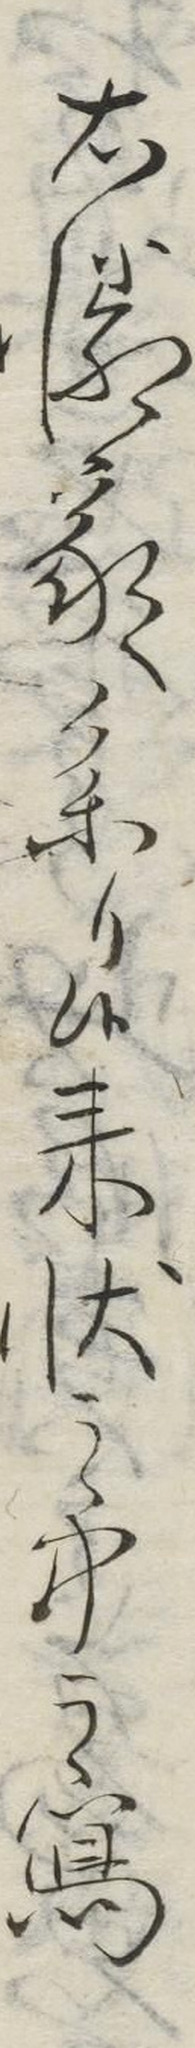右隣家へ参り候来状之中之写
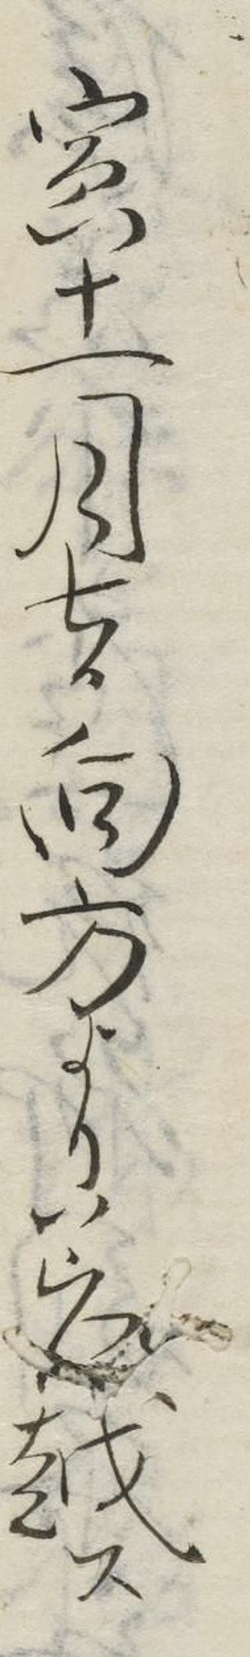寅十一月七日向方より差越ス
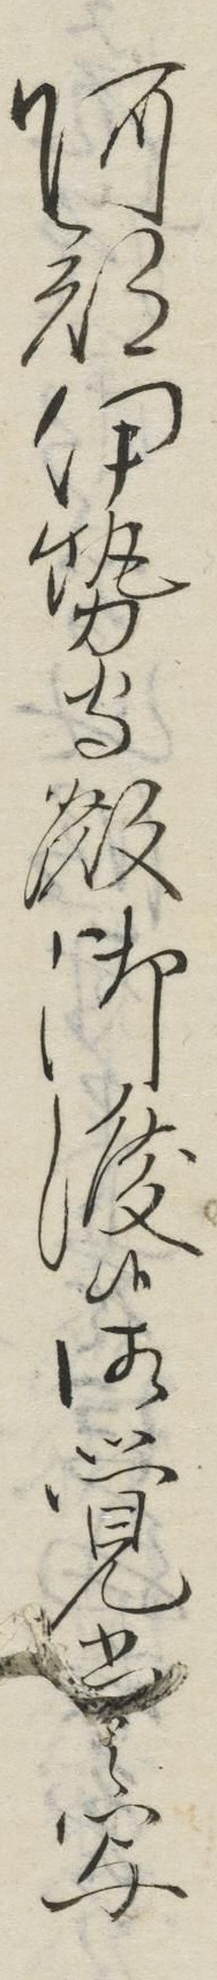阿部伊勢守殿御渡候御覚書之写
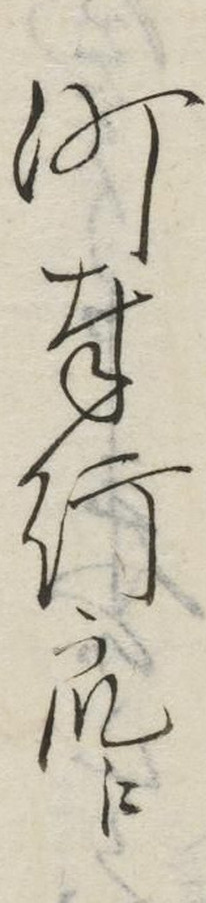町奉行衆え
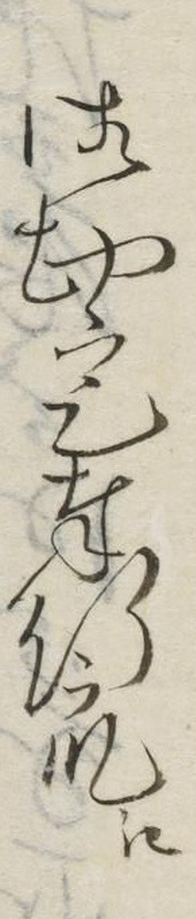御勘定奉行衆え覚
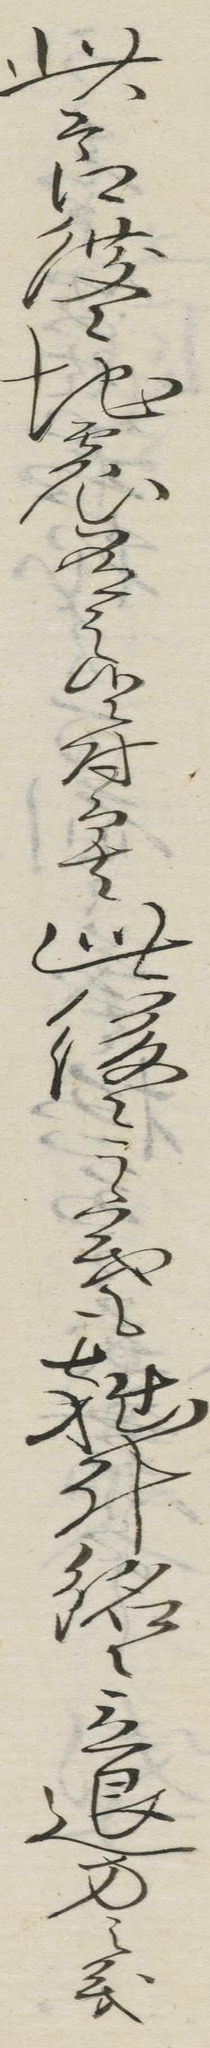此節度々地震有之候ニ付而は此後々之義も難計銘々立退方之義
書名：大地震實録
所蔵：東京大学地震研究所図書室 Earthquake Research Institute Library, The University of Tokyo, JAPAN
